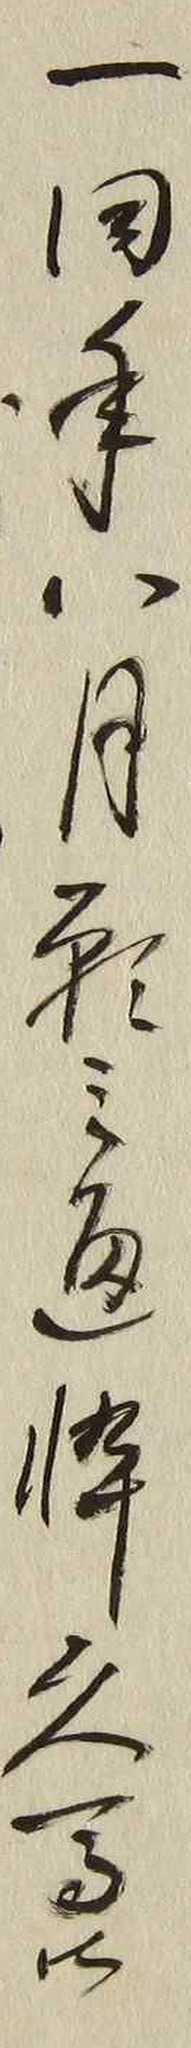一同年八月願之通忰久馬御
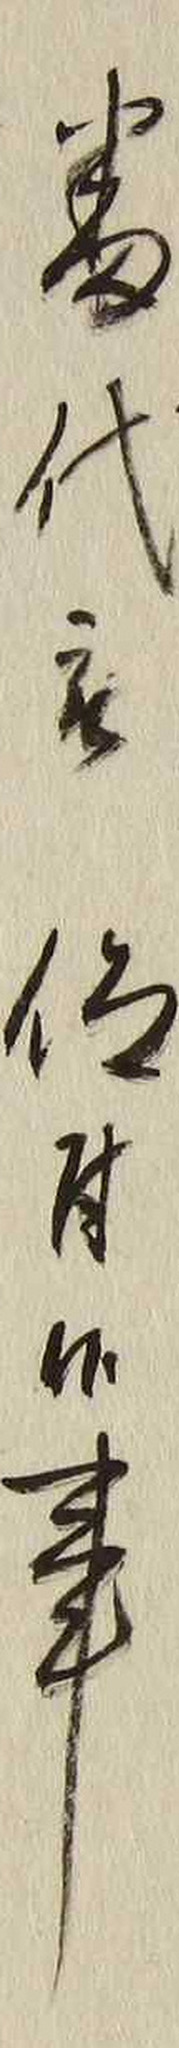番代被仰付候事
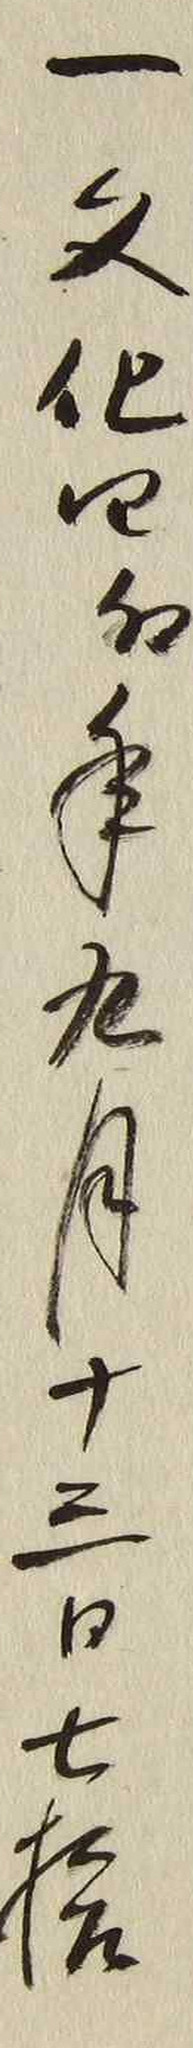一文化四卯年九月十三日七拾
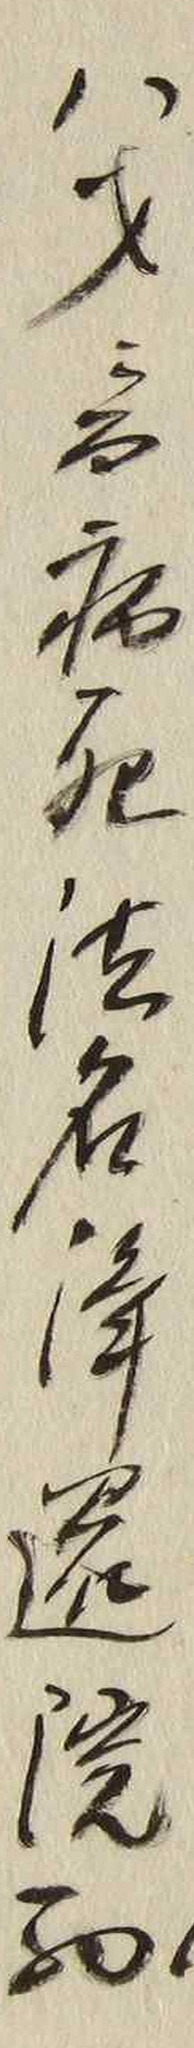八才ニ而病死法名浄還院西

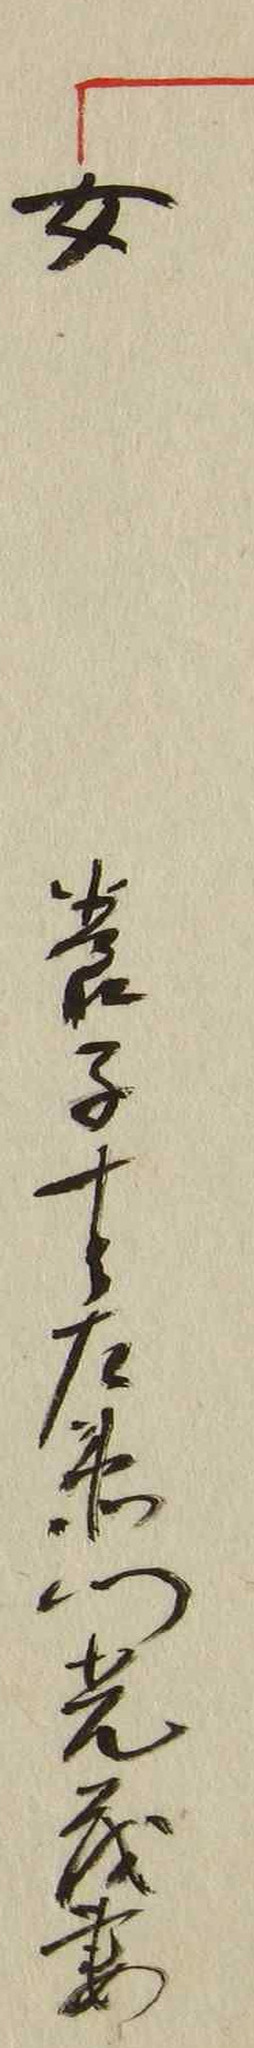女養子十郎左衛門光茂妻
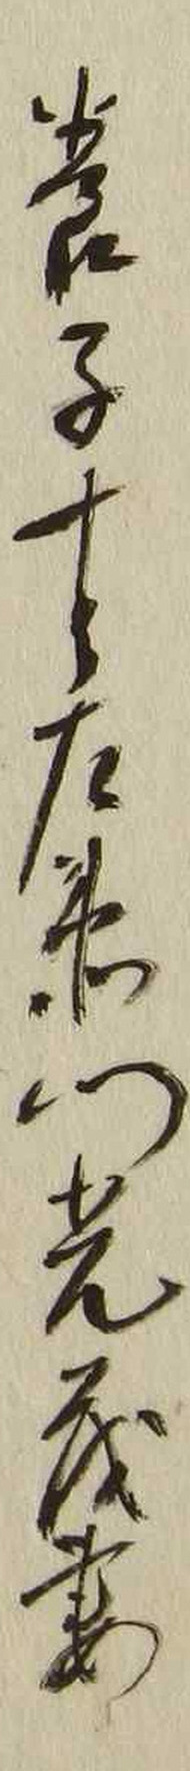女養子十郎左衛門光茂妻
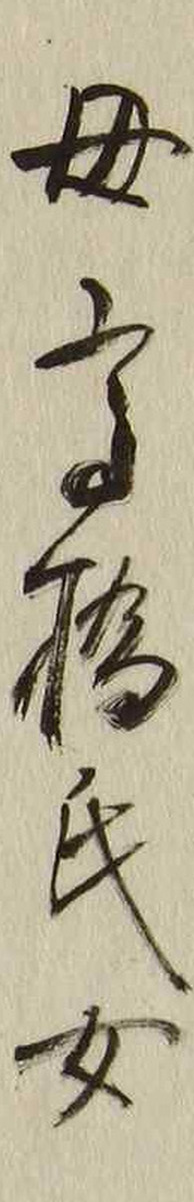母高橋氏女
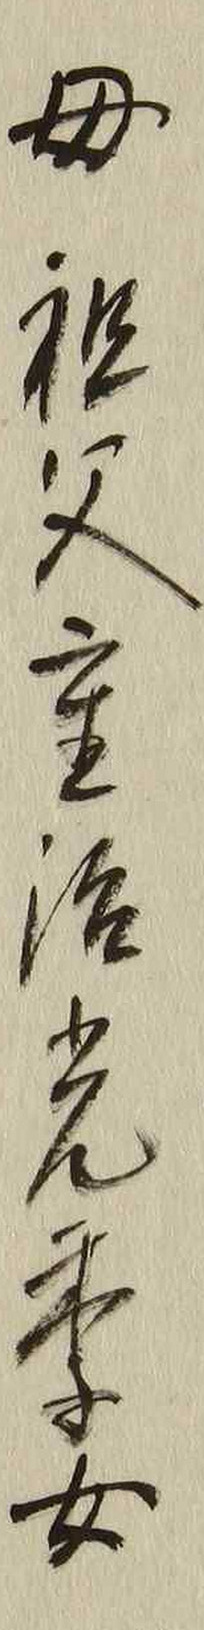母祖父重治光季女
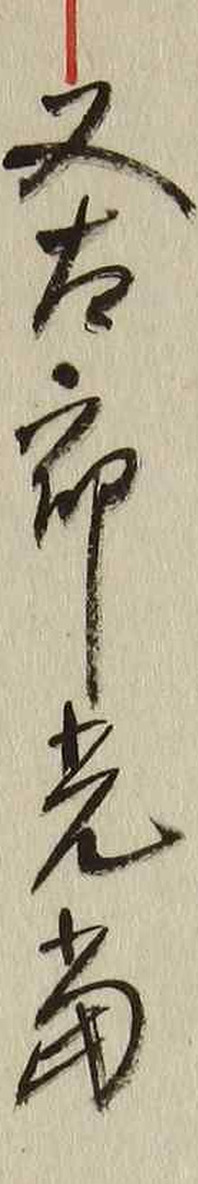又太郎光当
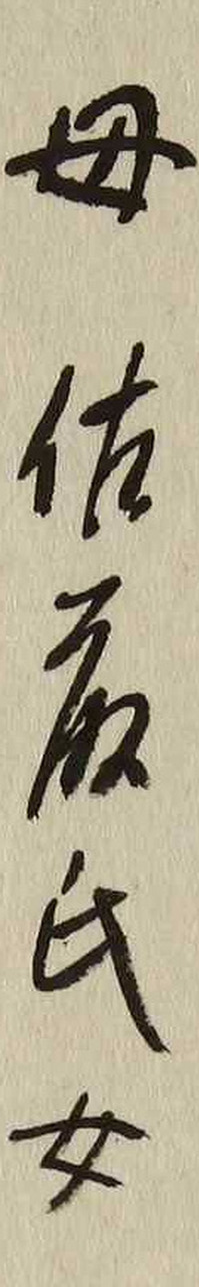母佐藤氏女
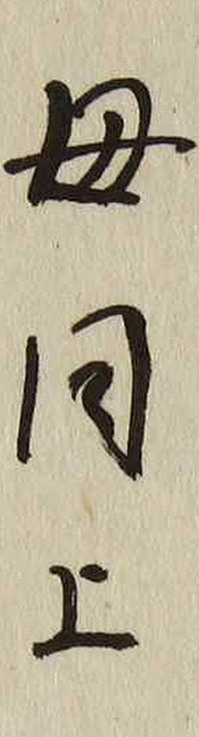母同上
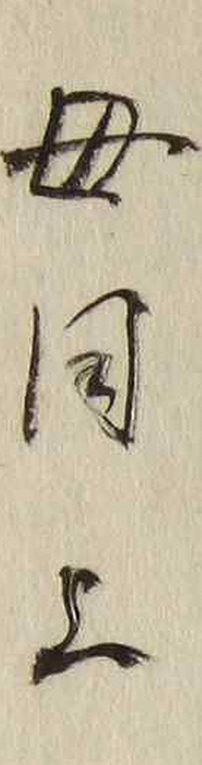母同上

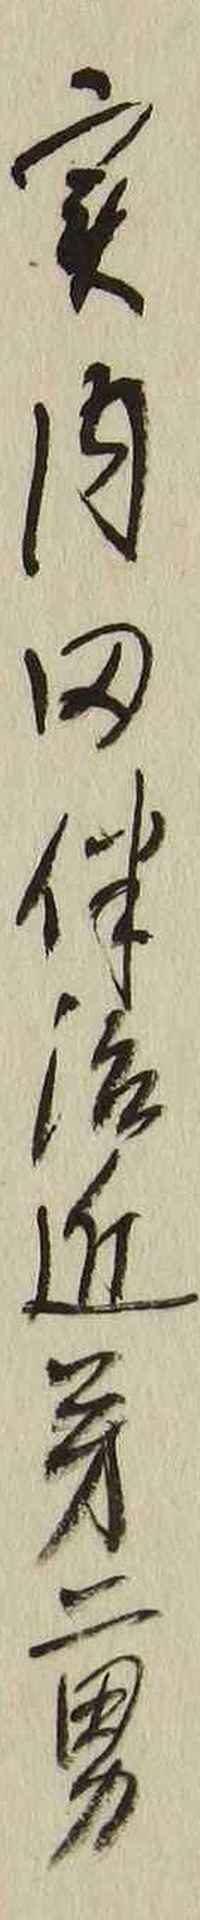実内田伴治近芳二男
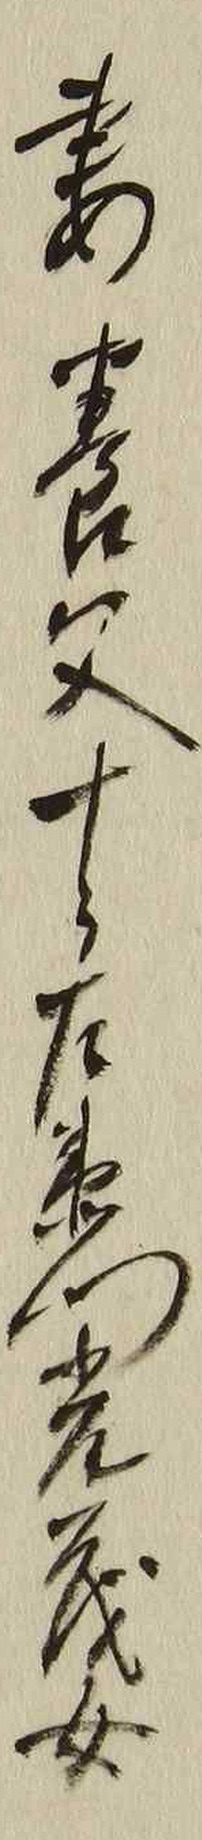妻養父十郎左衛門光茂女
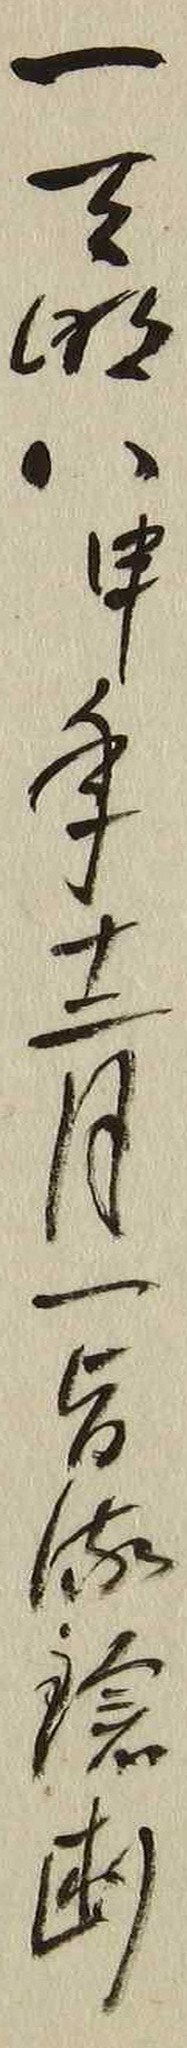一天明八申年十二月一旨流鎗術
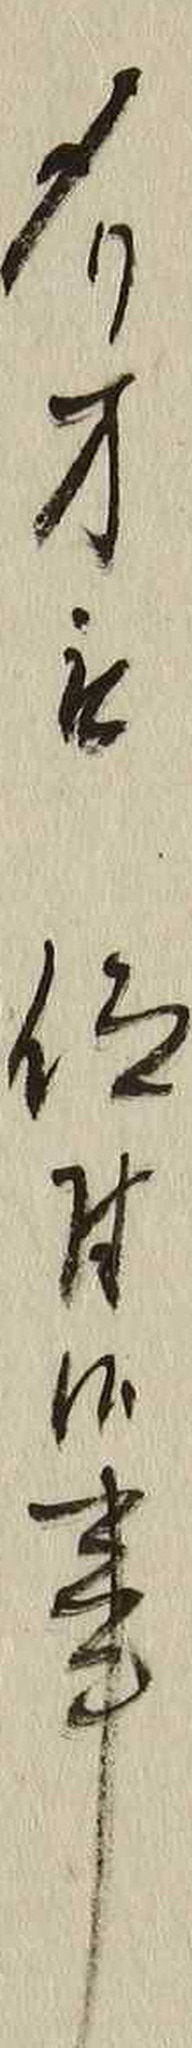〆り方被仰付候事
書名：諸士系譜　巻之359　す之部9
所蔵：会津若松市立会津図書館
